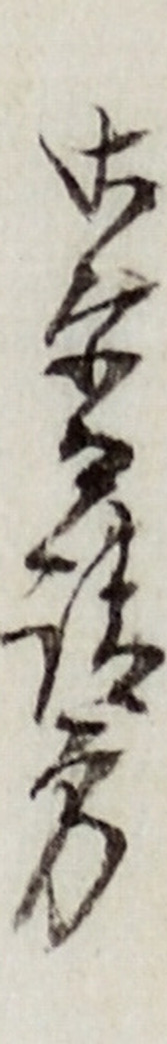御普請方
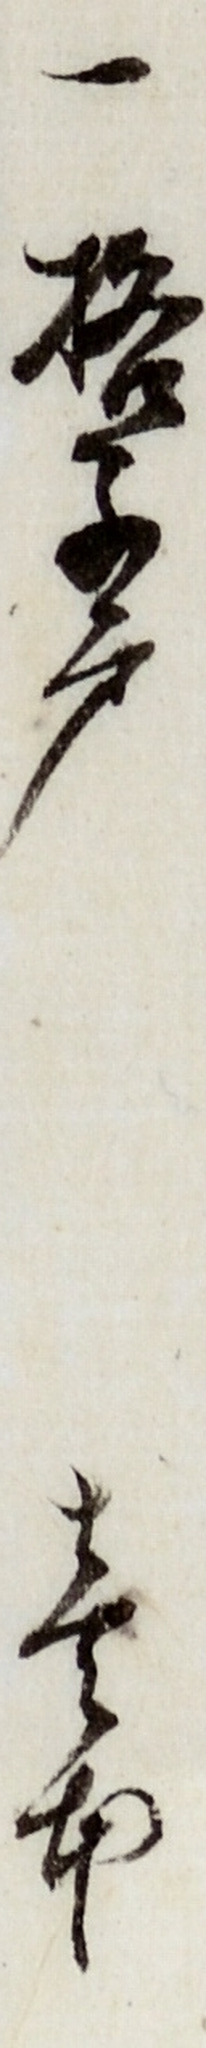一格子戸壱本
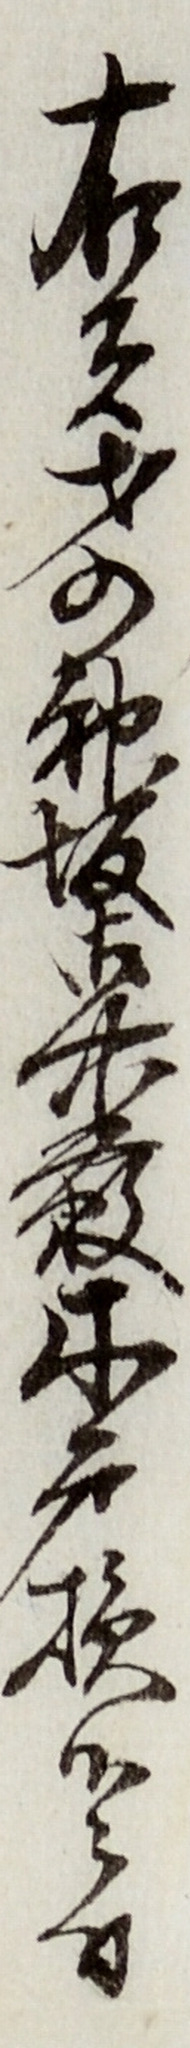右者才の神坂御竹薮木戸損候ニ付
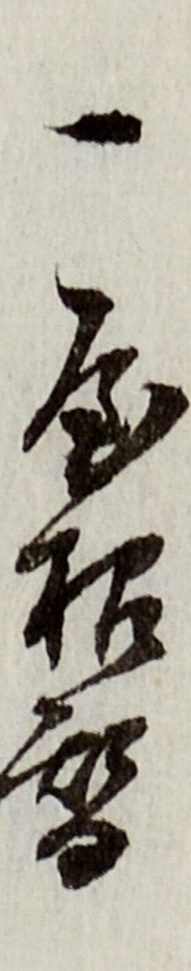一屋根替
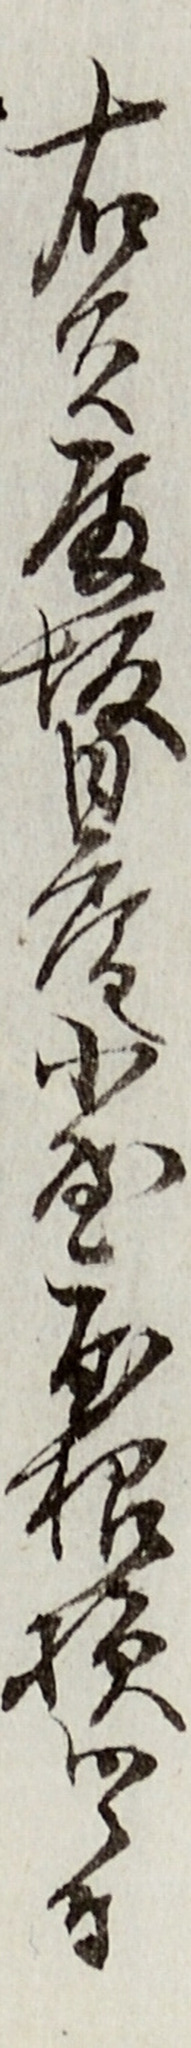右者殿坂日雇小屋屋根損候ニ付
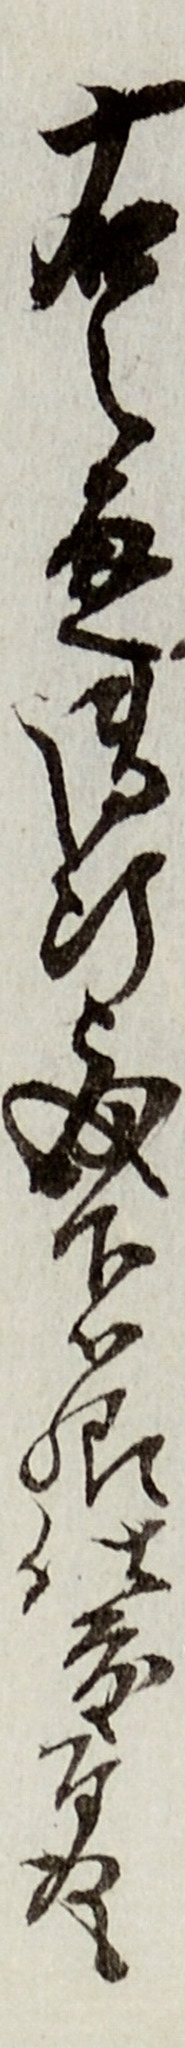右之通御断被成下候様仕度奉存候
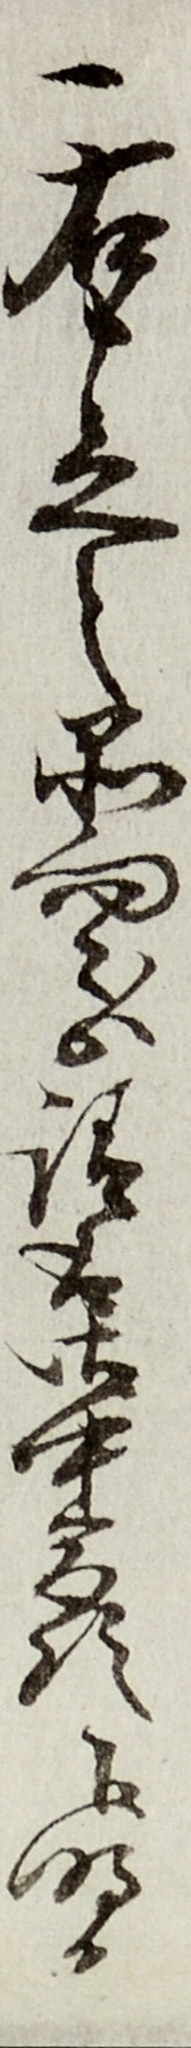一右申立之品向々ゟ請取御中間頭江明日
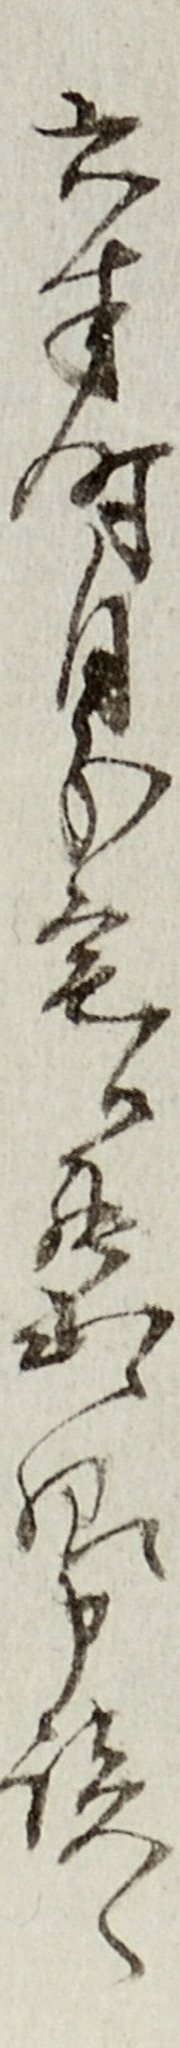六半時自分宅江罷出候様申談候
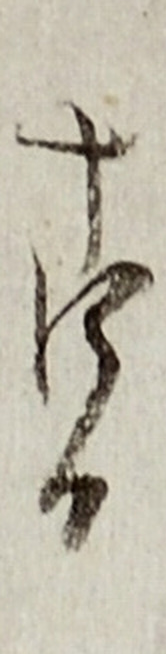十四日
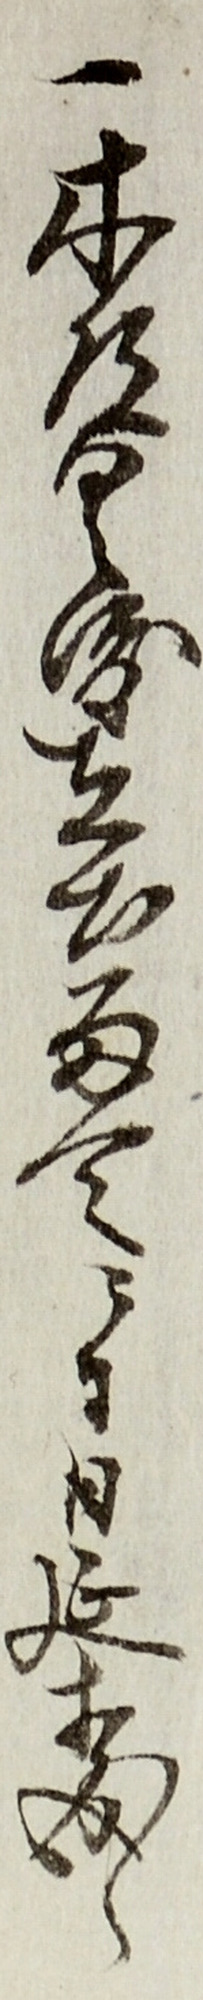一木道具渡在出雨天ニ付日延相成候
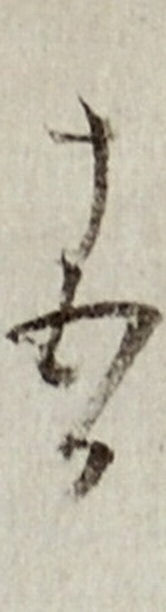十五日
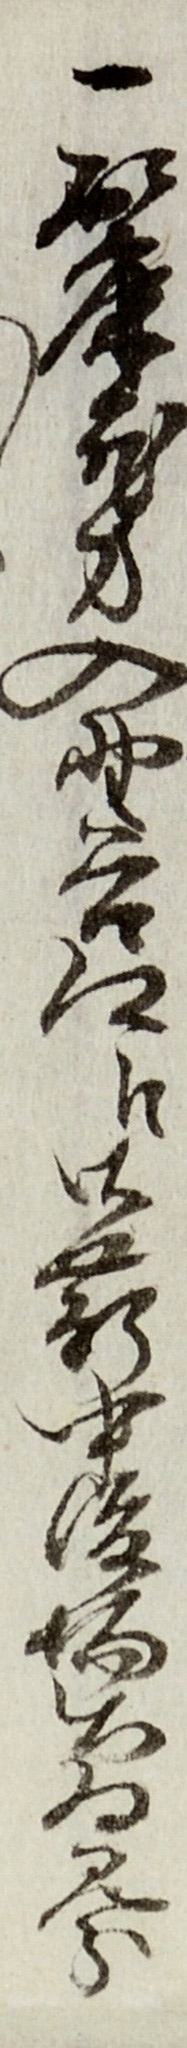一麗蔵方入野谷郷江御薪中渡場出為見分
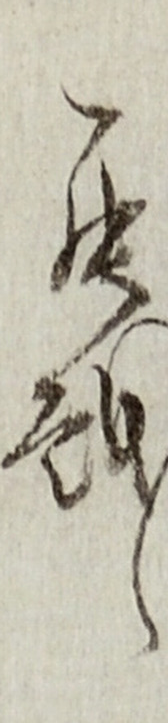罷越候
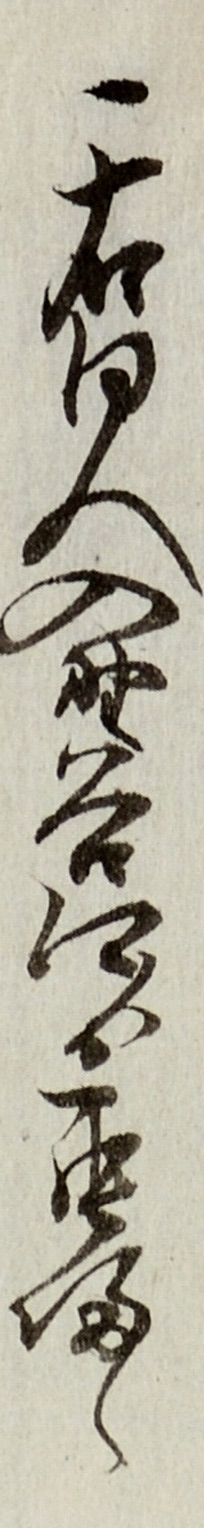一右同人入野谷郷ゟ罷帰候
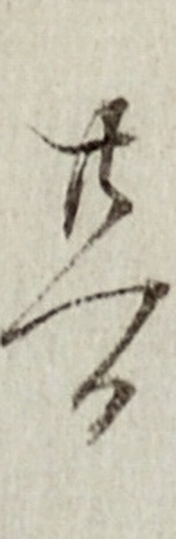廿一日
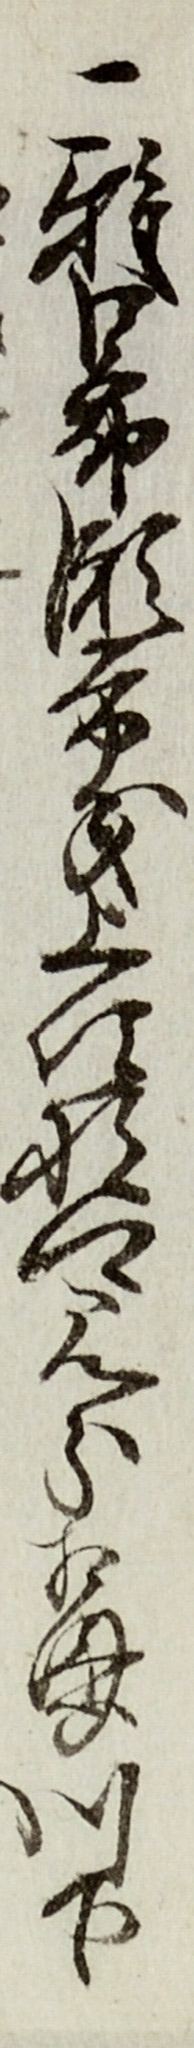一雅四郎瀬市義上伊那郷見分相済川下
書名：御山方御薪方諸事御用留
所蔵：伊那市立高遠町図書館・合同会社AMANE
